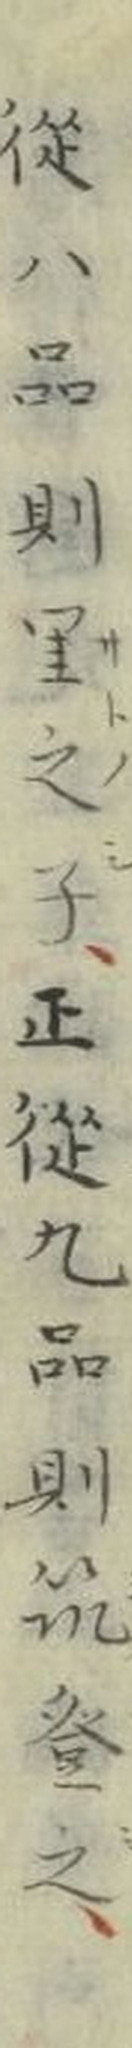従八品則里之子、正従九品則筑登之、
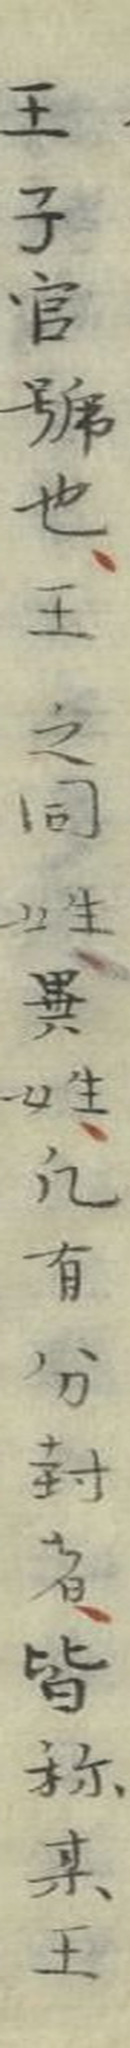王子官號也、王之同姓、異姓、凡有分封者、皆称某王
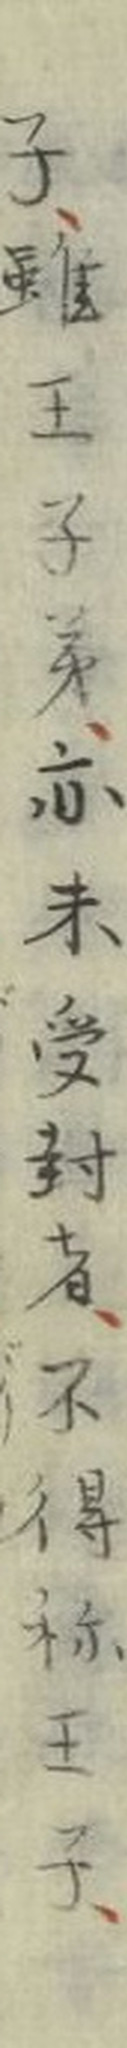子、雖王子弟、亦未受封者、不得称王子、
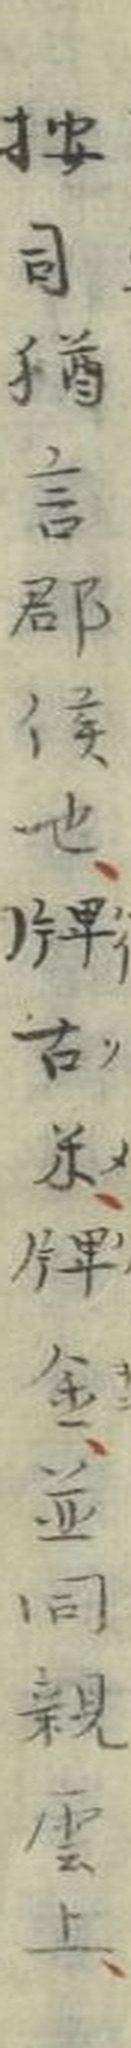按司尚言郡侯也、牌古米、牌金、並同親雲上、
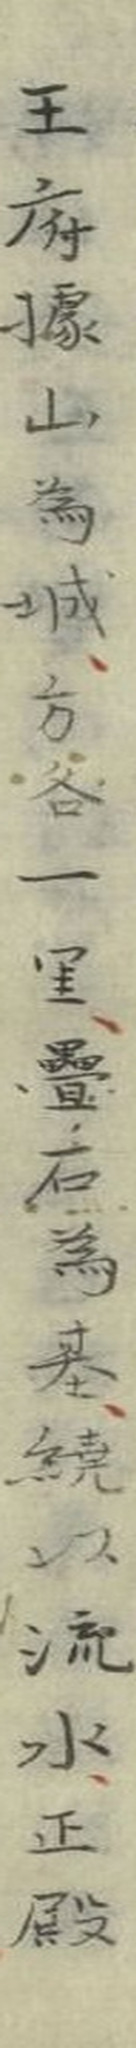王府據山為城、方各一里、畳石為基、繞以流水、正殿
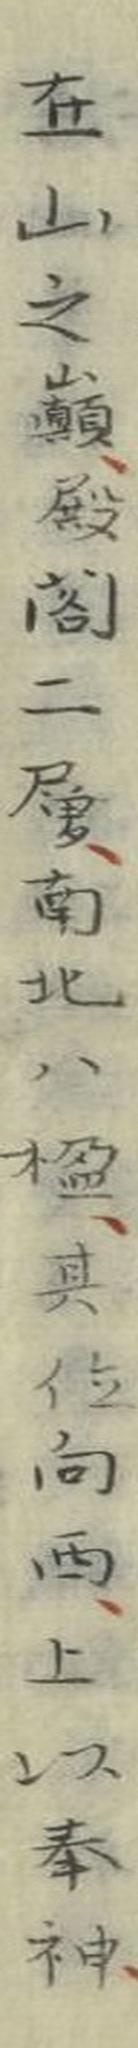在山之嶺、殿閣二層、南北八楹、其位向西、上以奉神、
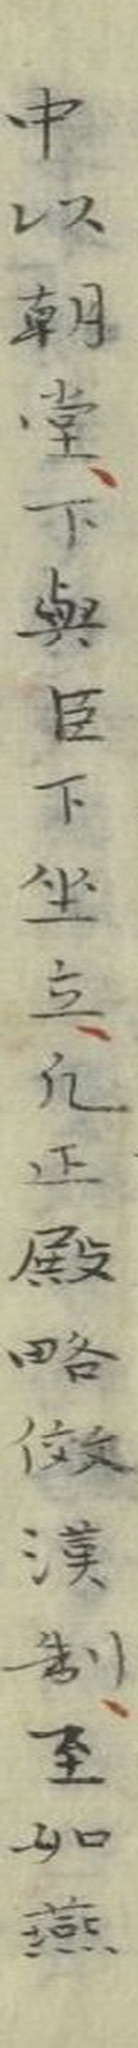中以朝堂、下与臣下坐立、凡正殿略傚漢制、至如燕
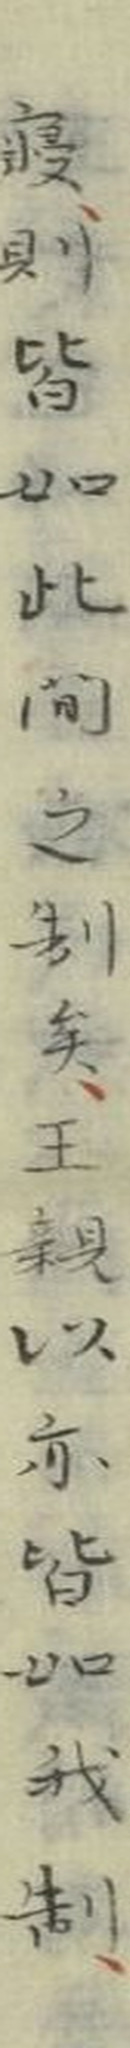寝、則皆如此間之制矣、王親以亦皆如我制、
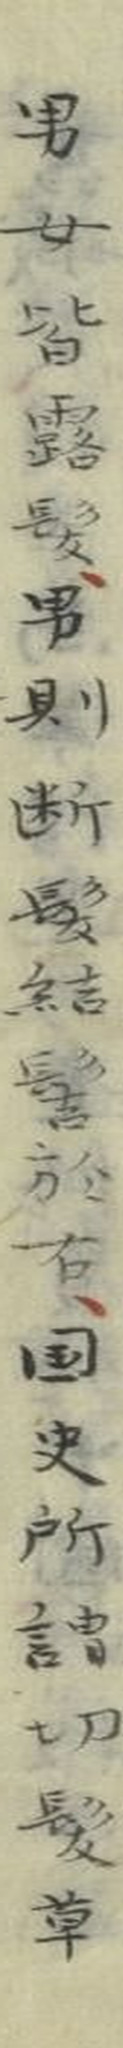男女皆露髪、男則断髪結髻於右、国史所謂切髪草
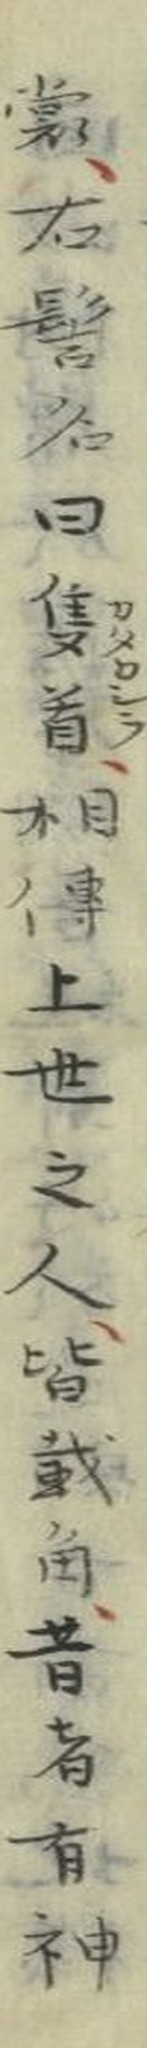裳、右髻名曰隻首、相伝上世之人、皆載角、昔者有神
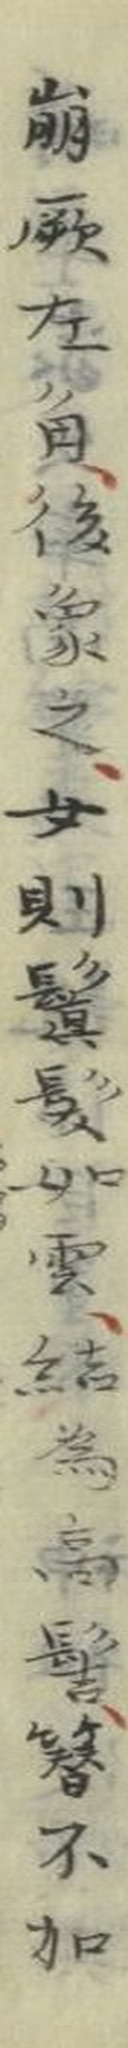崩厥左角、後象之、女則鬒髪如雲、結為高髻、簪不加
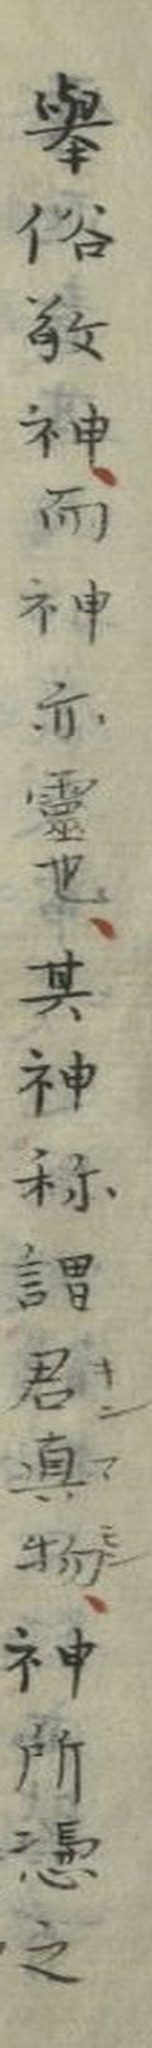擧俗敬神、而神亦霊也、其神称謂君真者、神所憑之
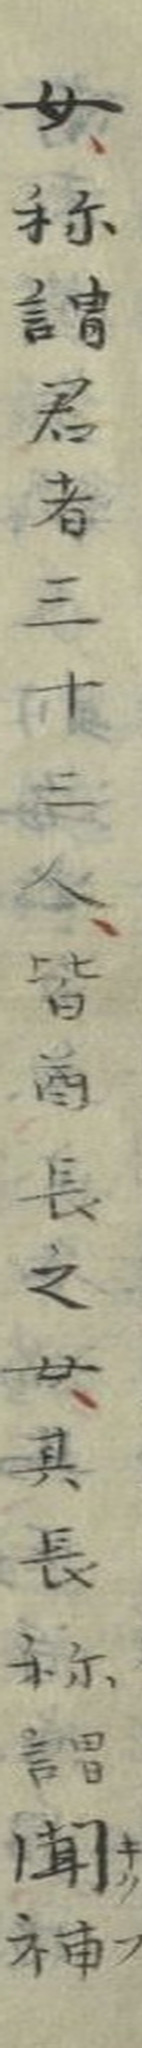女、称謂君者三十三人、皆酋長之女、其長称謂聞補
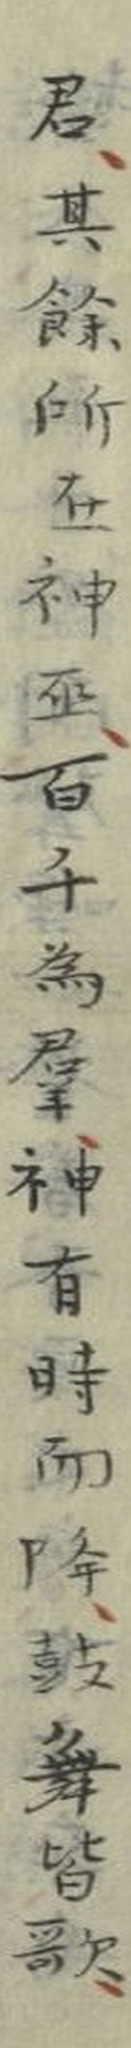君、其余所在神巫、百千為群。神有時而降、鼓舞皆歌、
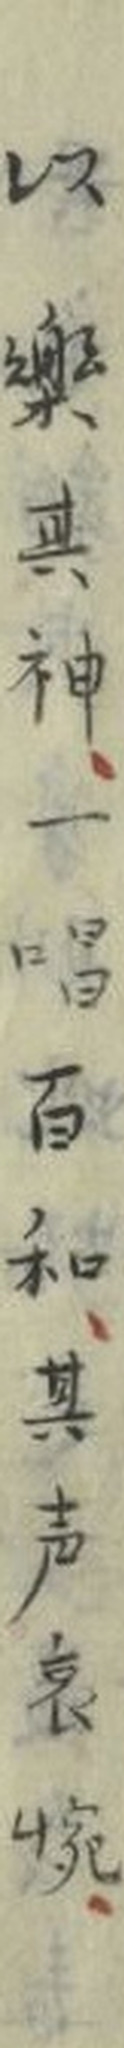以楽其神、一唱百和、其声哀婉、
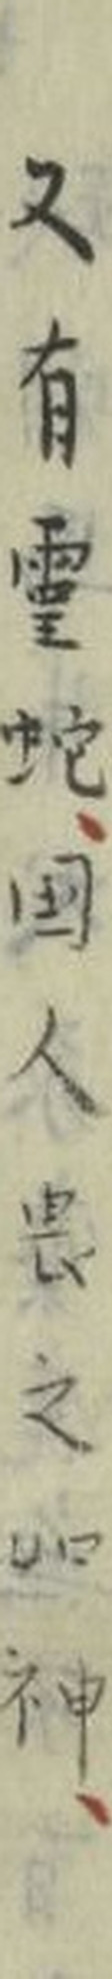又有霊蛇、国人畏之如神、
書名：琉球
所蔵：University of the Ryukyus Library
